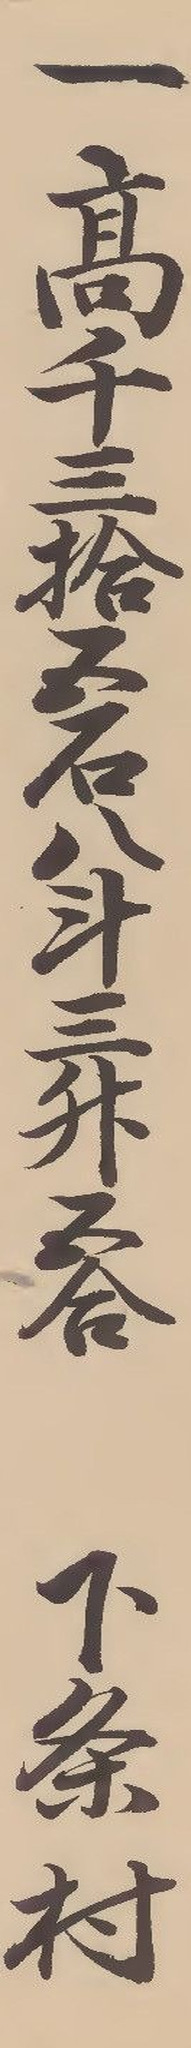一高千三拾五石八斗三升五合下条村
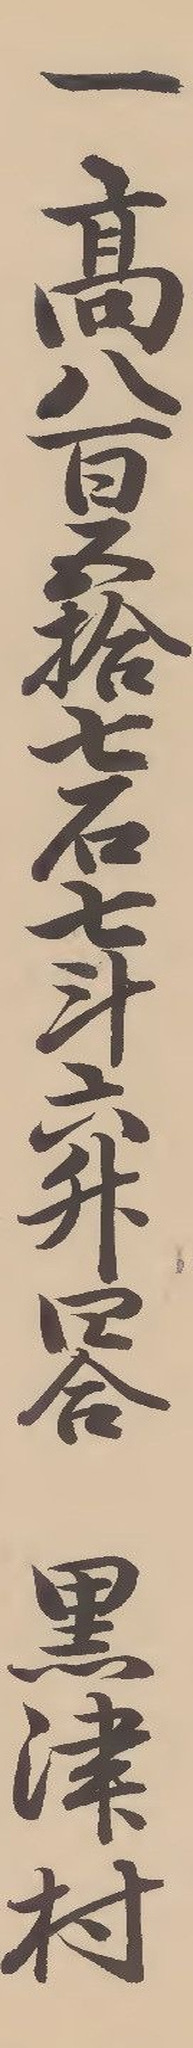一高八百五拾七石七斗六升四合黒津村
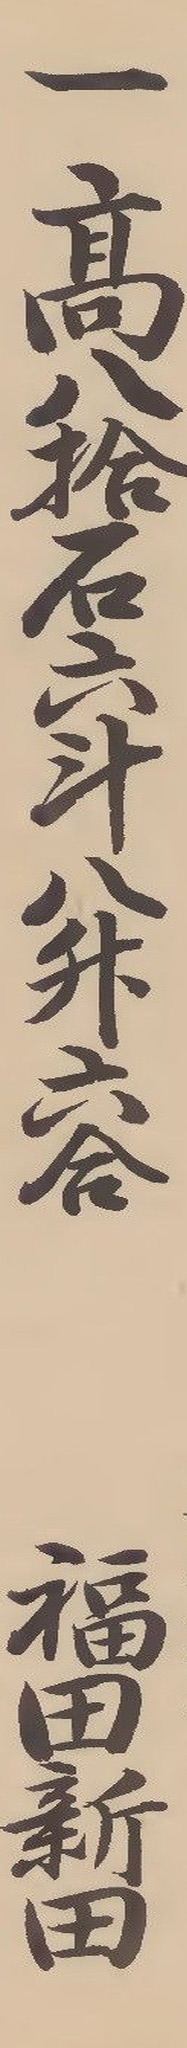一高八拾石六斗八升六合福田新田
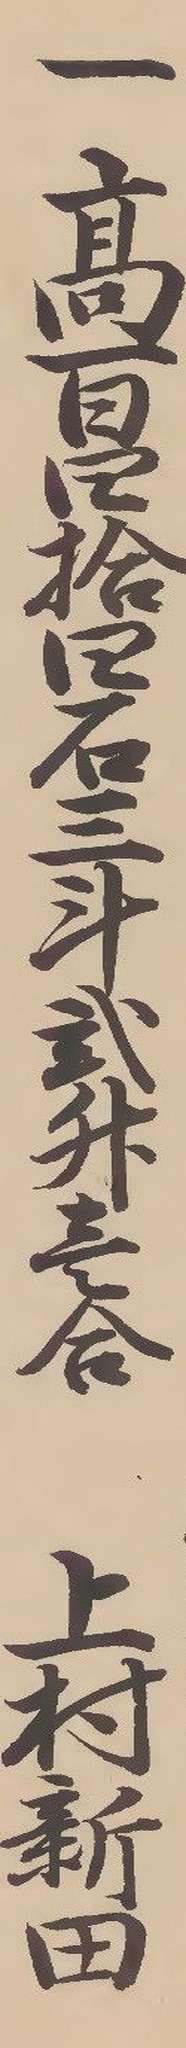一高百四拾四石三斗弐升壱合上村新田
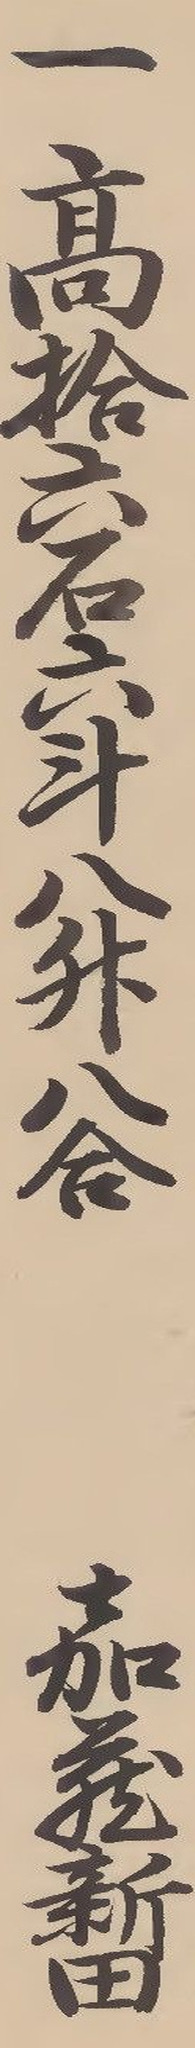一高拾六石六斗八升八合嘉蔵新田
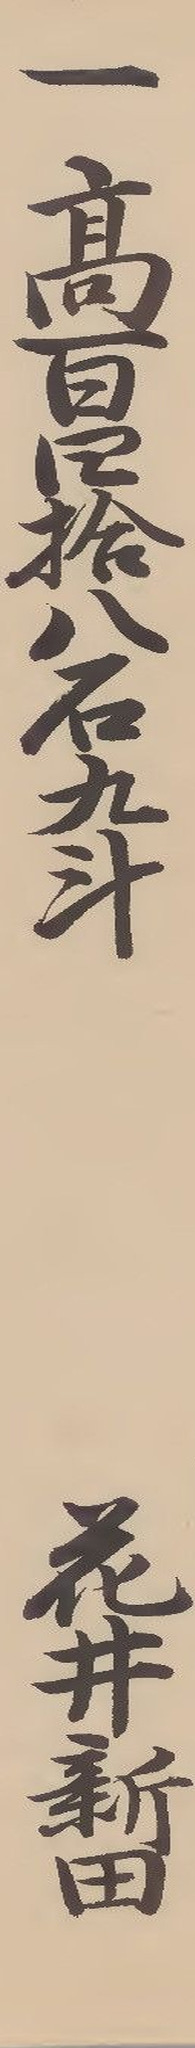一高百四拾八石九斗花井新田
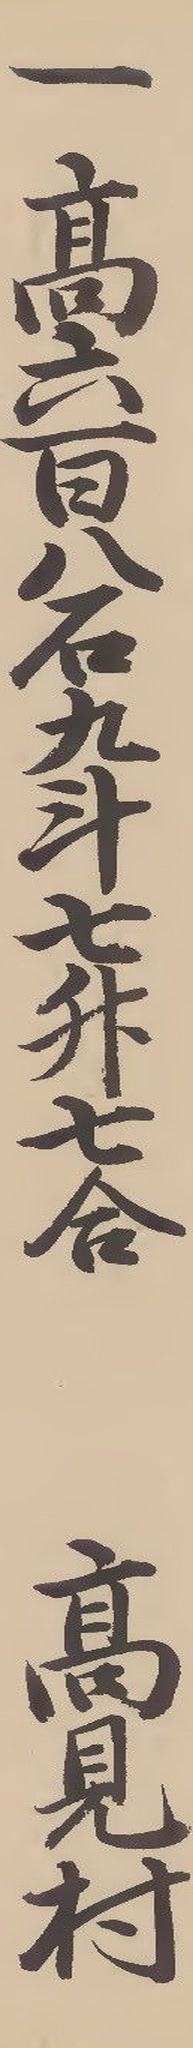一高六百八石九斗七升七合高見村

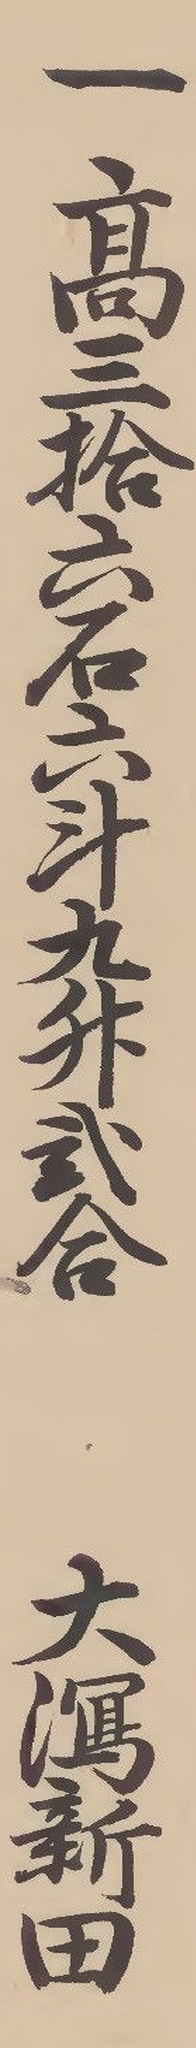一高三拾六石六斗九升弐合大潟新田
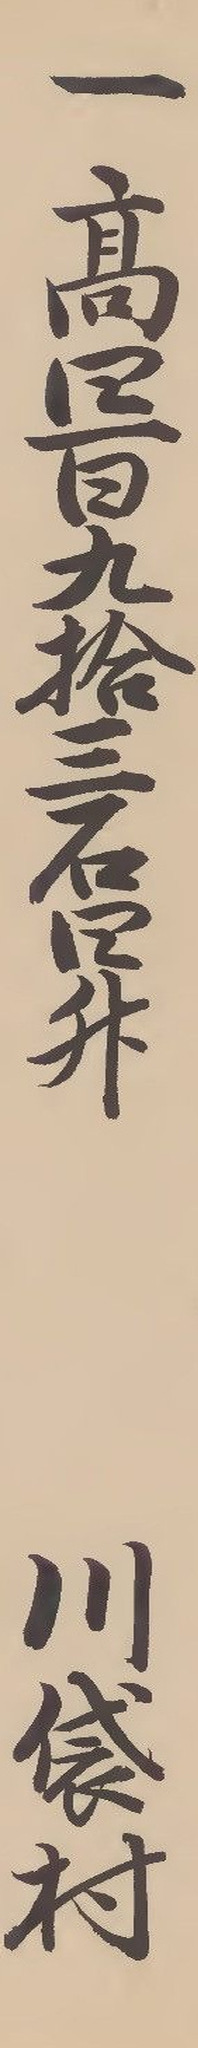一高四百九拾三石四升川袋村
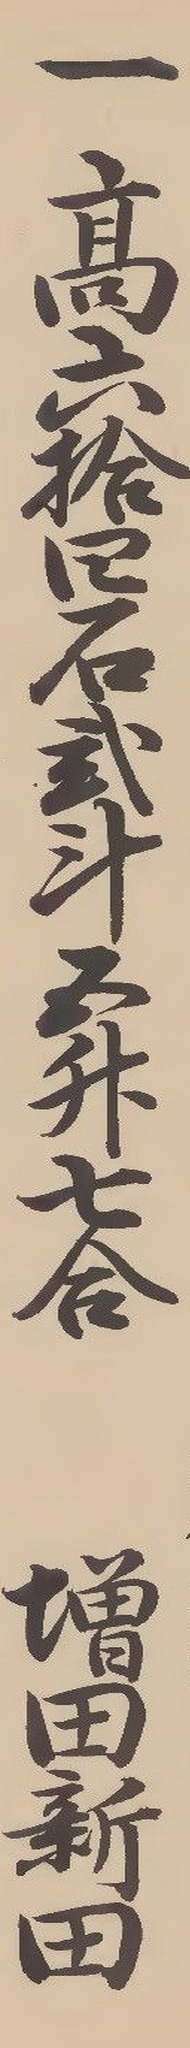一高六拾四石弐斗五升七合増田新田
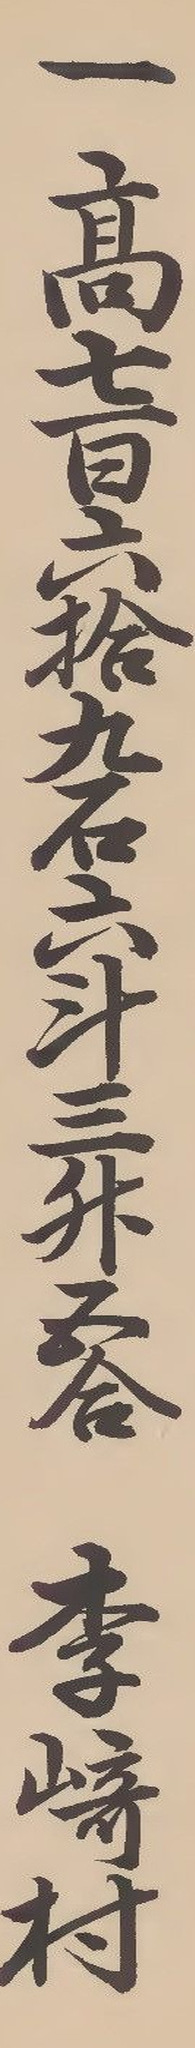一高七百六拾九石六斗三升五合李崎村
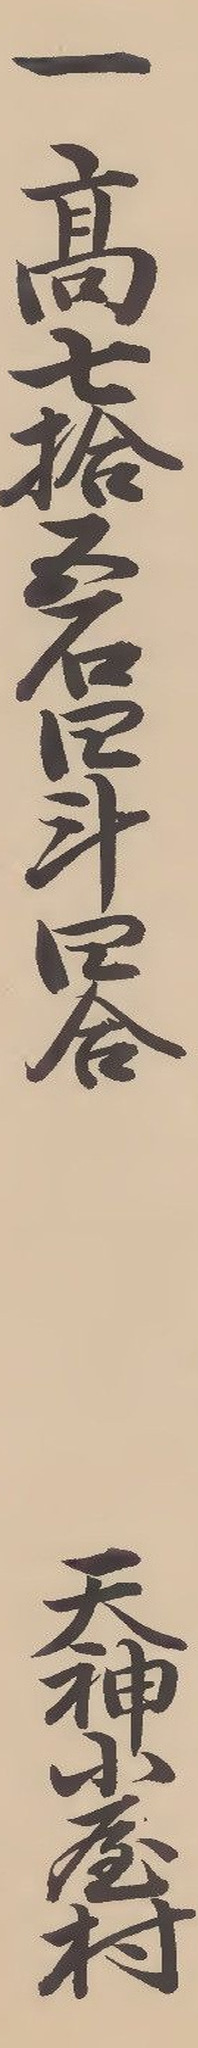一高七拾五石四斗四合天神小屋村
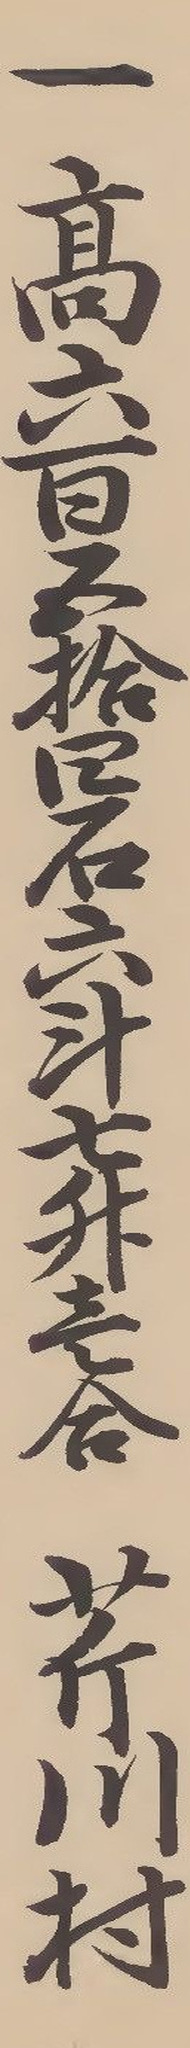一高六百五拾四石六斗七升壱合芹川村
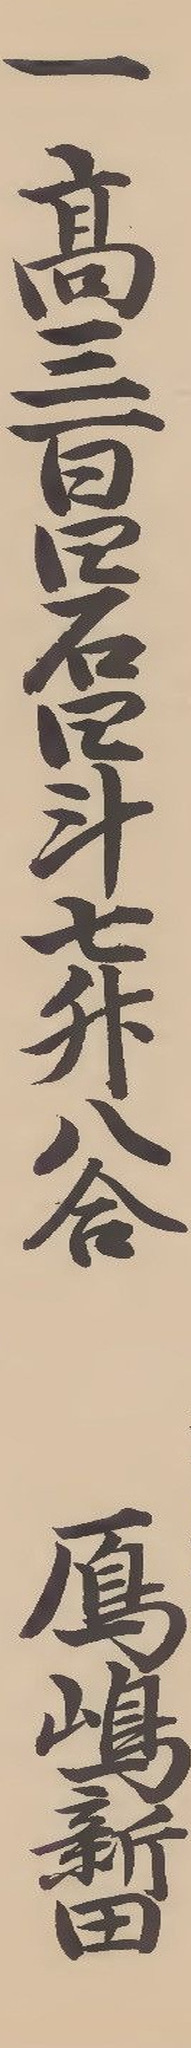一高三百四石四斗七升八合雁島新田
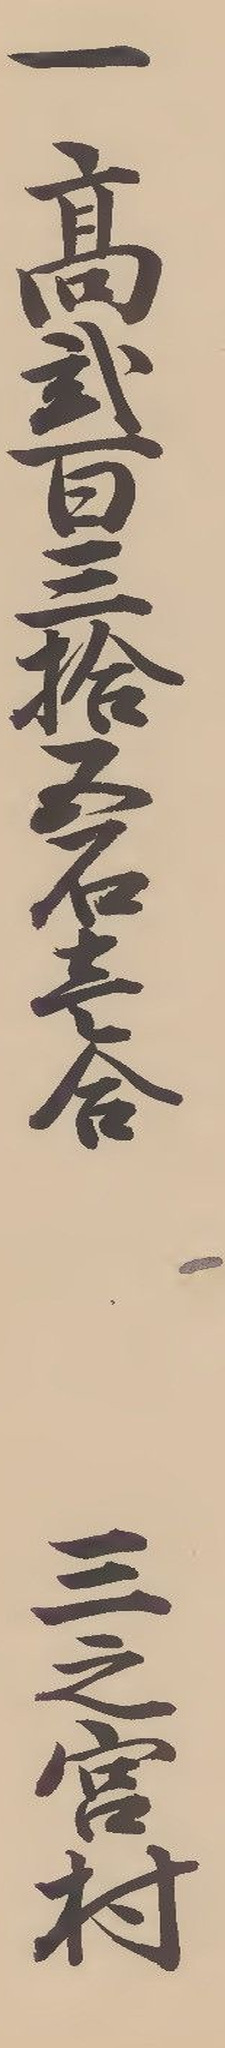一高弐百三拾五石壱合三之宮村

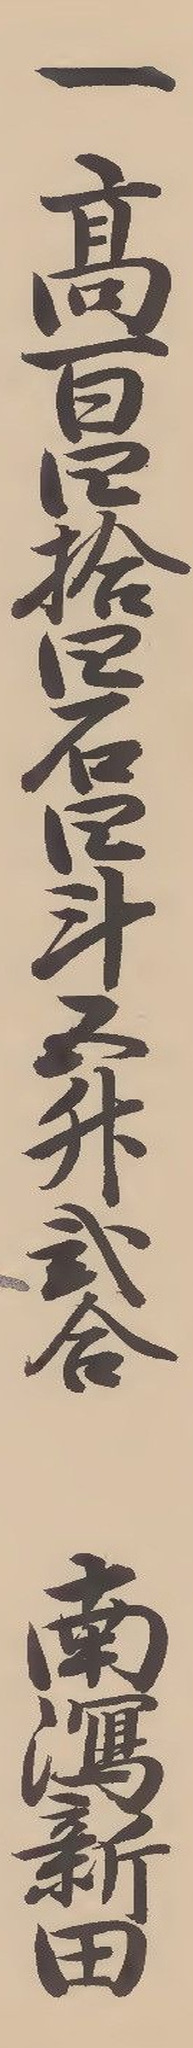一高百四拾四石四斗五升弐合南潟新田
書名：越後国郷帳　中
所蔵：国立公文書館 National Archives of Japan
